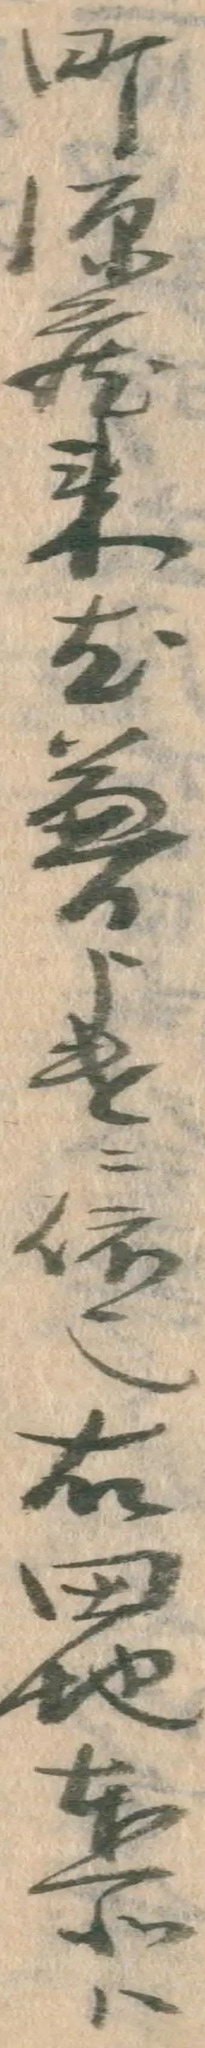町源蔵来、尤兼而申遣ニ依之、右田地本所ハ
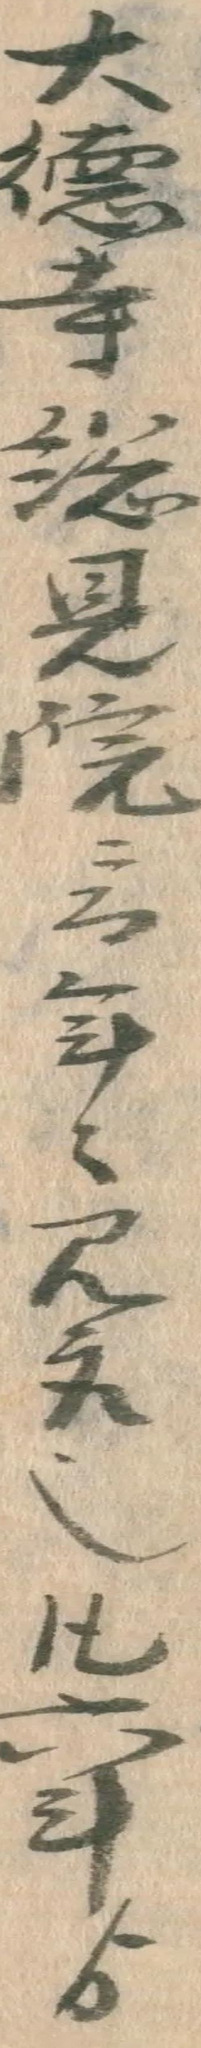大徳寺総見院ニ而、年々見取也、凡六斗ゟ
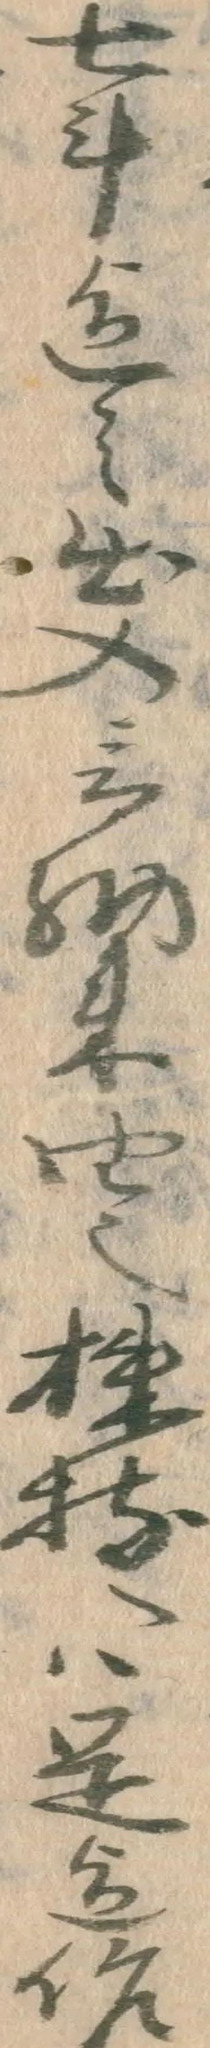七斗迄之出入ニ而納来由也、棟持ヘハ是迄作
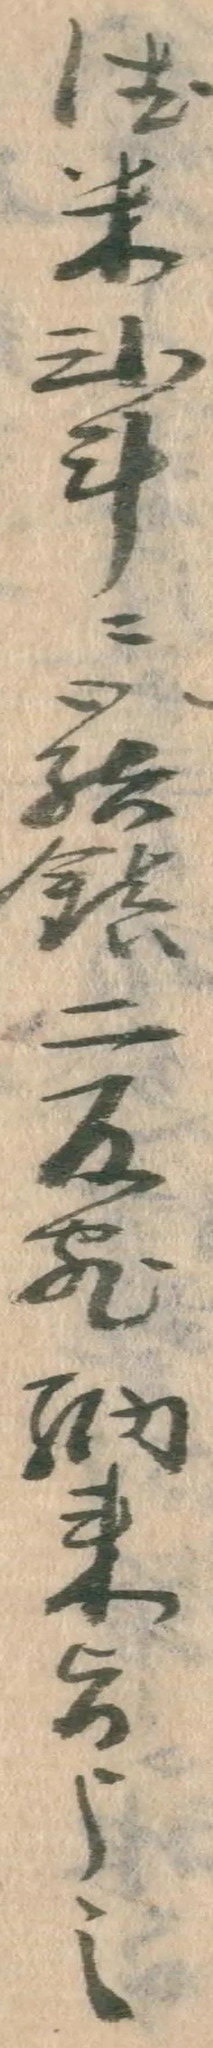往来弐斗ニ御結鎮二反宛納来旨申也、
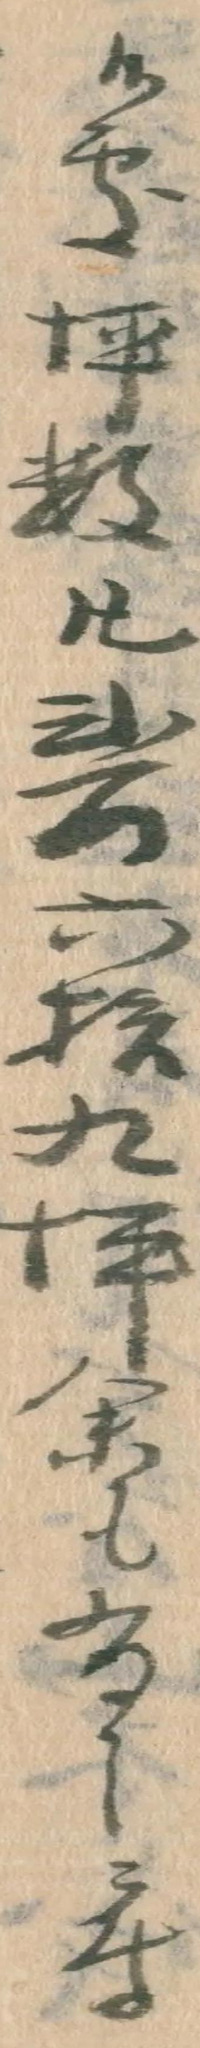候處、坪数凡弐百六拾九坪余も有之ニ付、
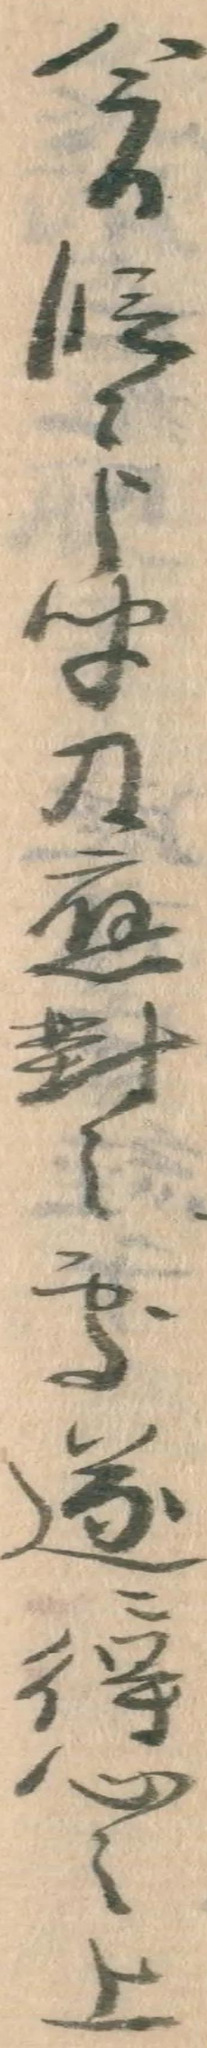今日段々申聞及、應對之處、遂ニ得心之上
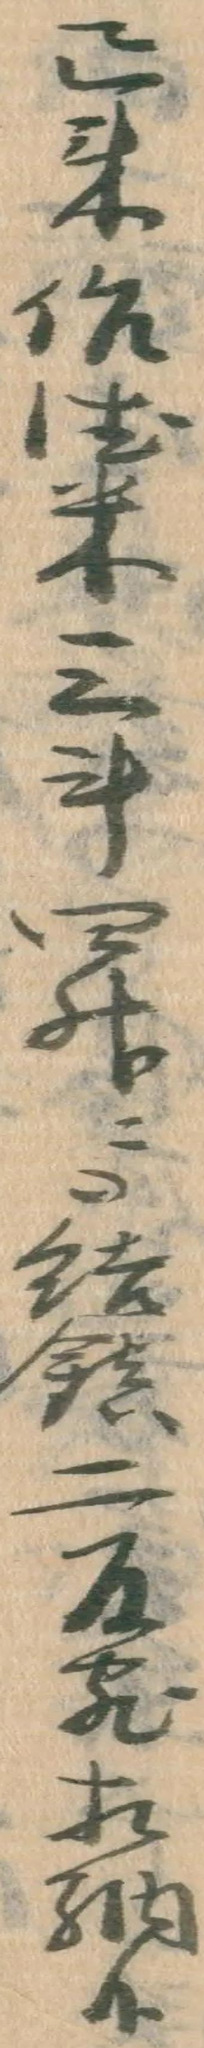已来作往来三斗四升ニ御結鎮二反宛相納候
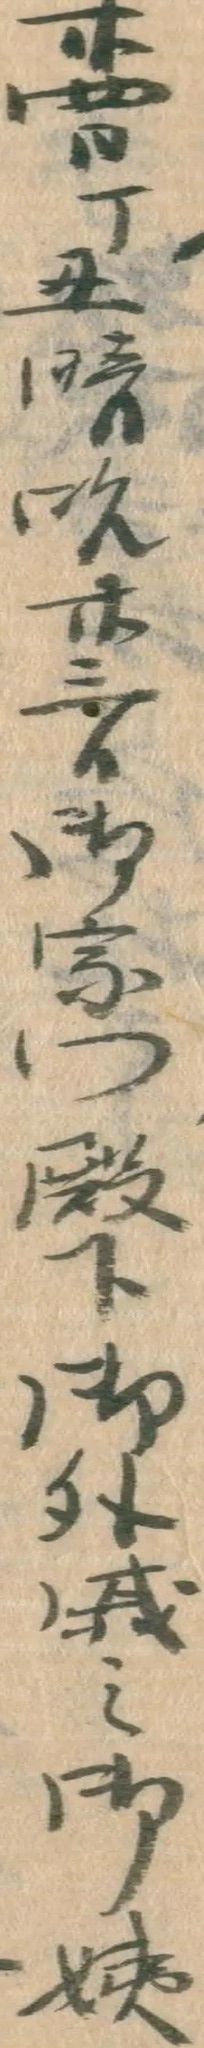廿四日丁丑晴、晩廿三日御家門殿下御外威之御姨
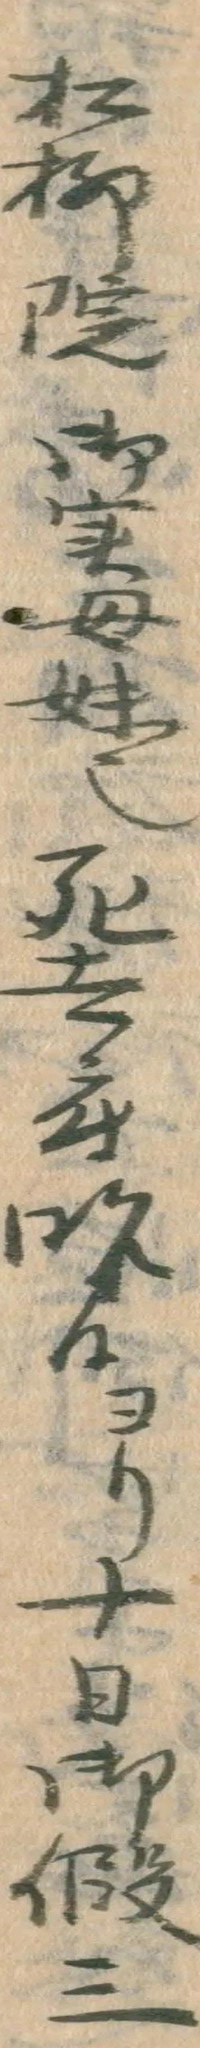松柳院御実母妹也、死去ニ付、昨日ヨリ十日御暇三
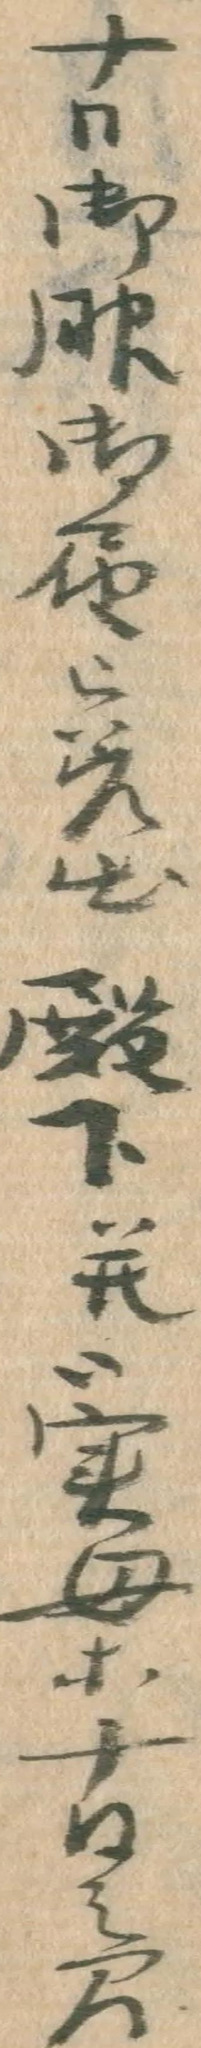十日御服御届被差出、殿下并御実母等十日之間
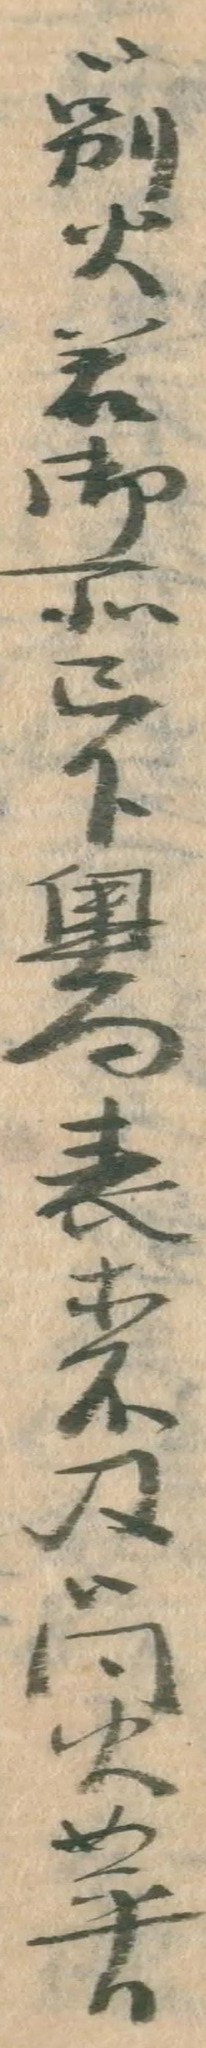ハ別火、若御所已下奥向表等不及ハ同火如平日
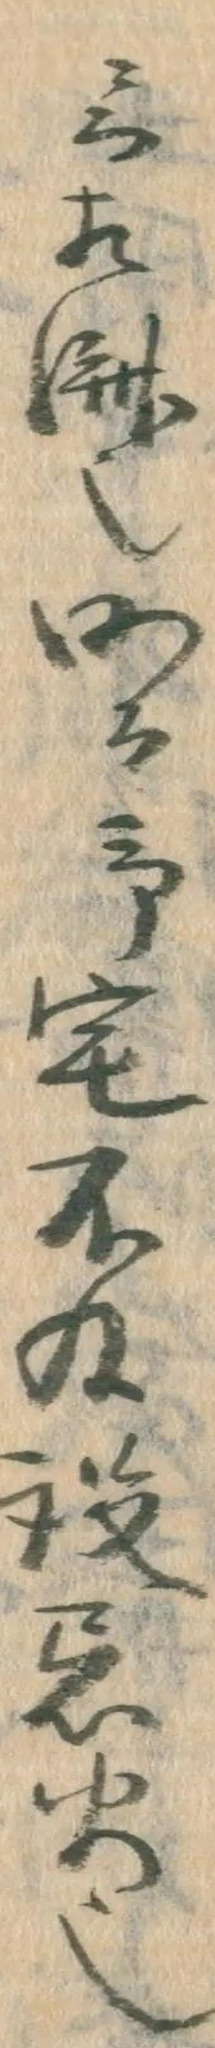ニ而相済也、仍而予宅不及致忌火也、
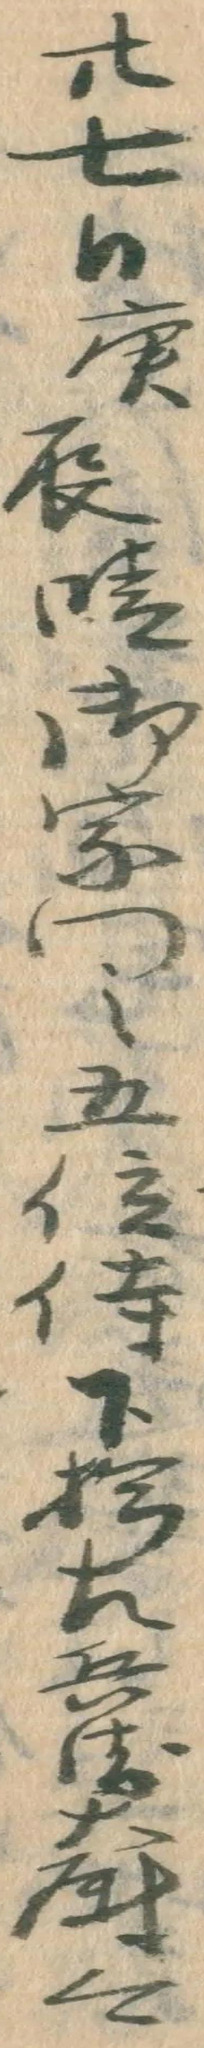廿七日庚辰晴、御家門之五位侍下杉左兵衛大尉、今
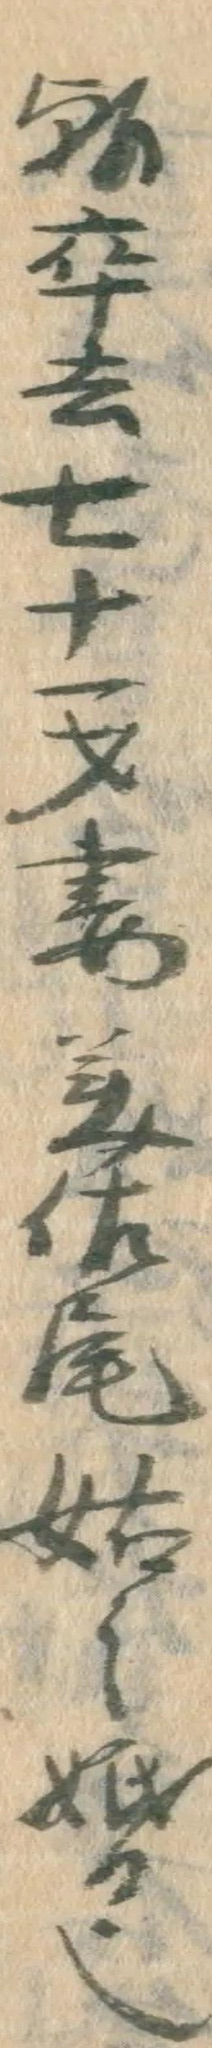朝卒去七十一才、妻美佐尾姑之娘か也、
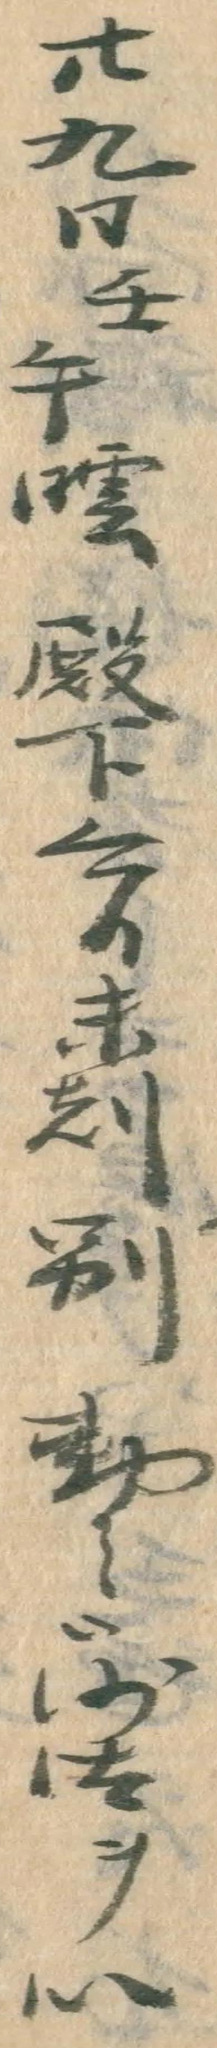廿九日壬午雲、殿下今日未刻別動之御沙汰ヲ以
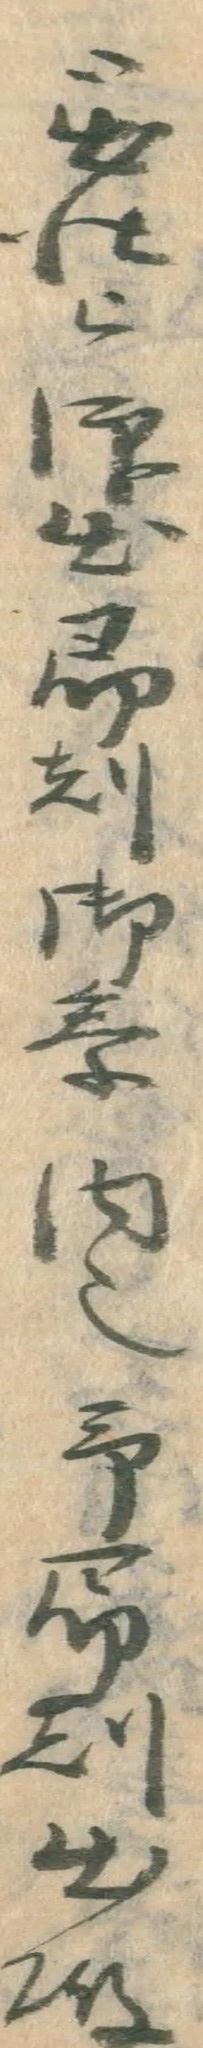御出仕被仰出、即刻御参内也、予即刻出殿、
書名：賀茂社記録. 第63冊
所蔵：国立国会図書館 National Diet Library, JAPAN
